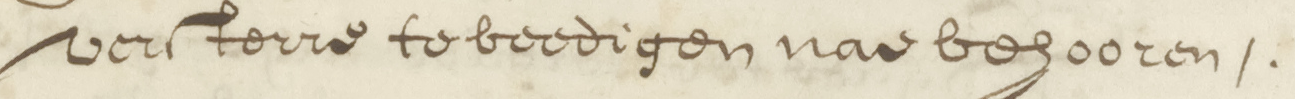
versterre te beedigen nae behooren.
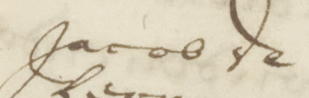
Jacob de
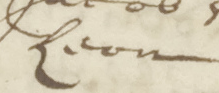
Leon
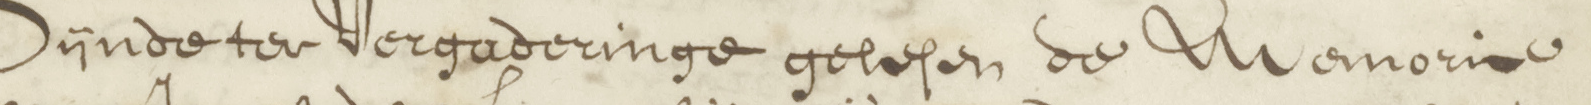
Sijnde ter Vergaderinge gelesen de Memorie
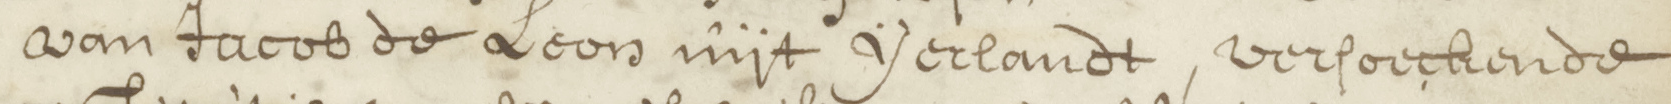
van Jacob de Leon uijt Yerlandt, versoeckende
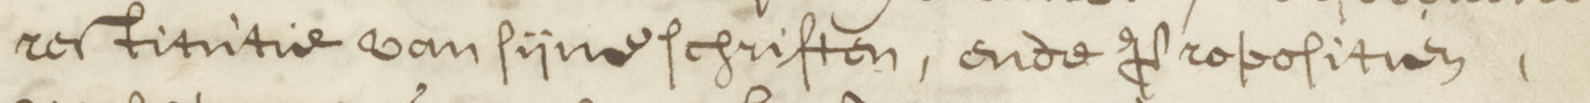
restitutie van sijne schriften, ende Propositien,
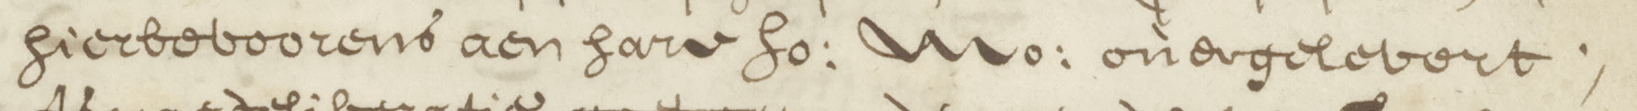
hierbevoorens aen hare Ho:Mo: ouergelevert;
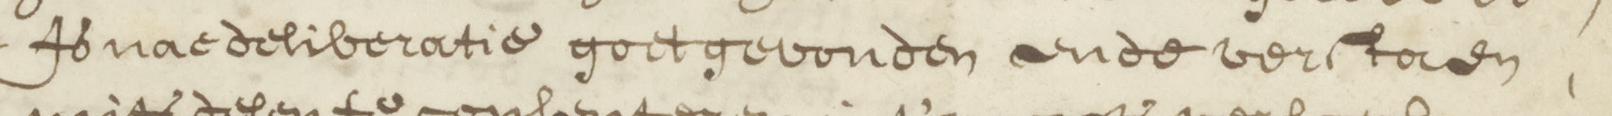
Is nae deliberatie goetgevonden ende verstaen,
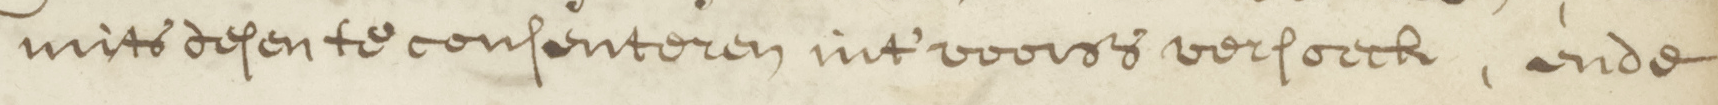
mits desen te consenteren int' voorsz versoeck, ende
